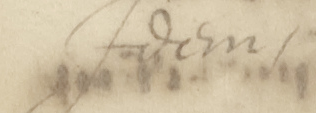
Idem
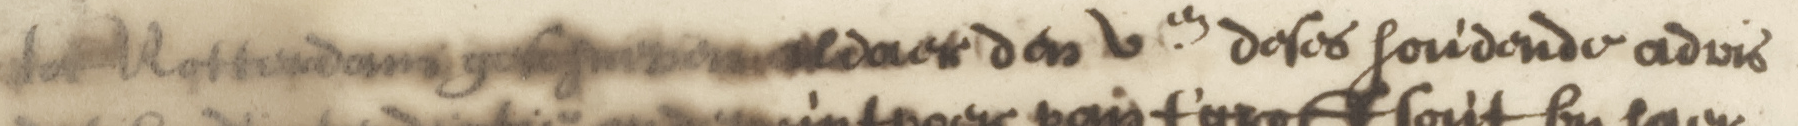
te Rotterdam geschreven aldaer den ven deses houdende advis
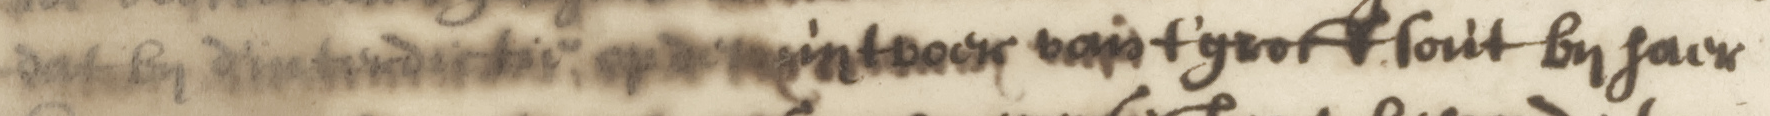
dat by d'interdictie op de vuytvoer van t'groffsout by haer
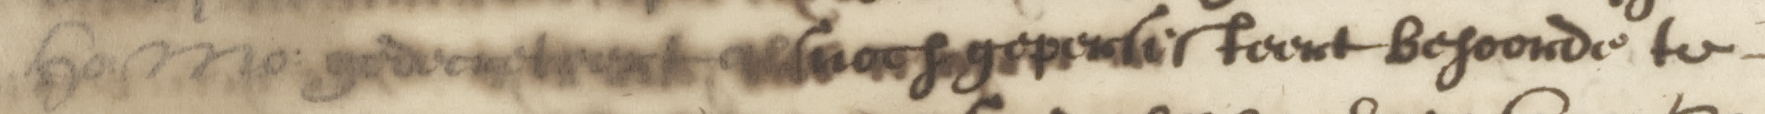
Ho:Mo: gedecreteert alsnoch gepersisteert behoorde te
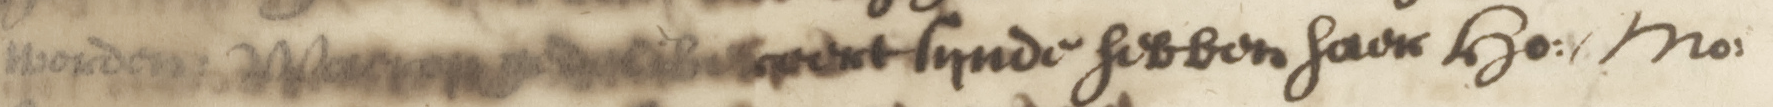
worden. Waerop gedelibereert synde hebben haer Ho:Mo:
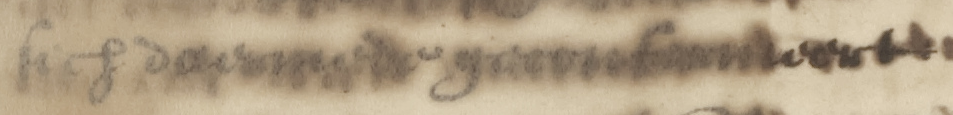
sich daermede geconformeert.
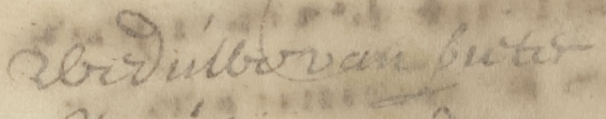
weduwe van Pieter
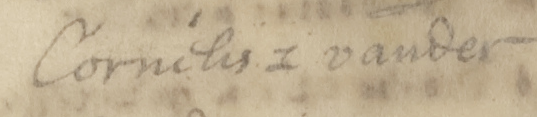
Cornelisz vander
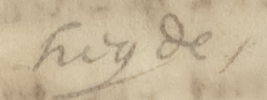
Heyde
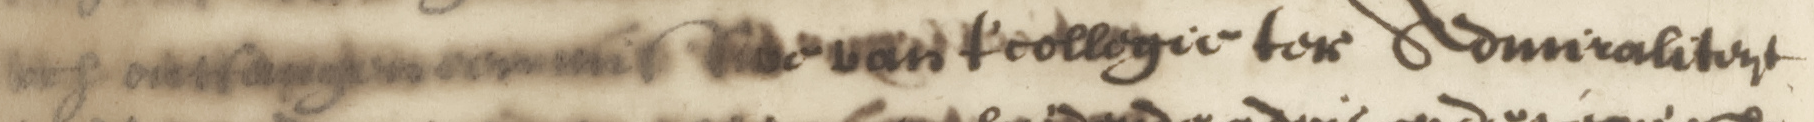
Noch ontfangen een missive van t'collegie ter Admiraliteyt
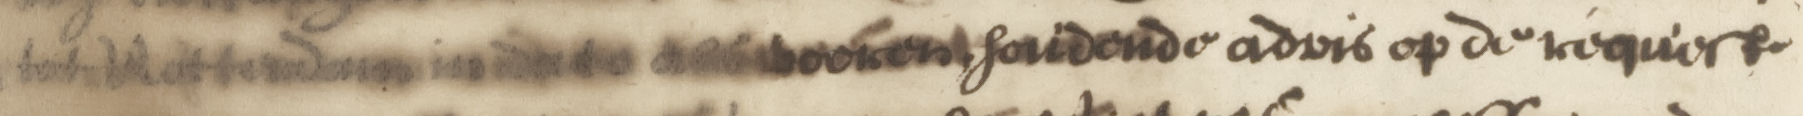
tot Rotterdam in dato als vooren, houdende advis op de requeste
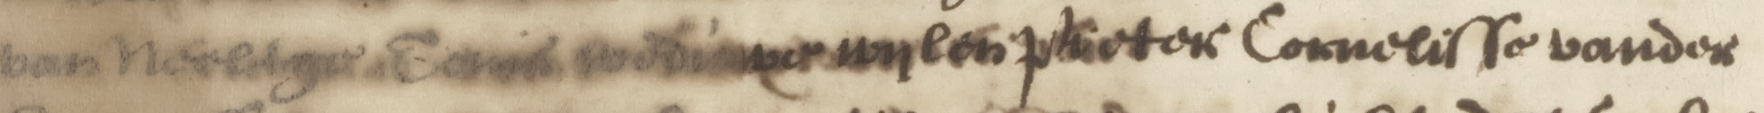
van Neeltge Tonis, weduwe wylen pieter Cornelisse vander
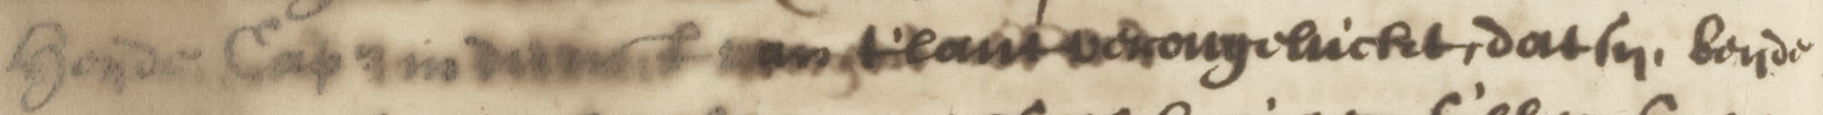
Heijde Capn. in dienst van t'lant verongeluckt, dat sy, beyde
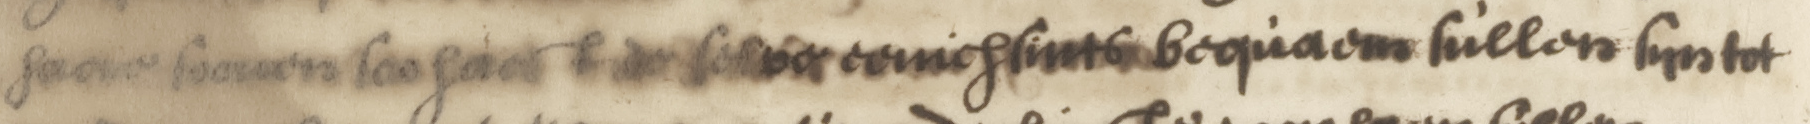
haere soonen soo haest de selve eenichsints bequaem sullen syn tot
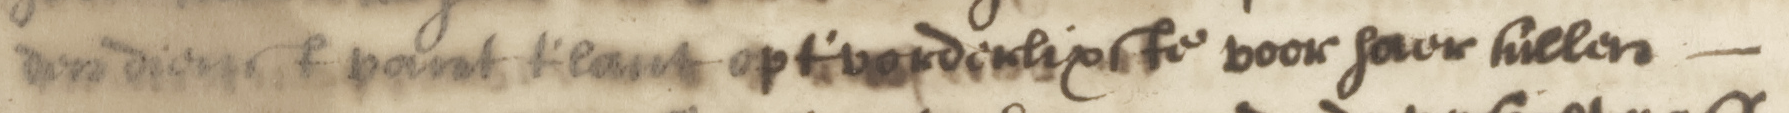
den dienst vant t'lant op t'vorderlixste voor haer sullen —
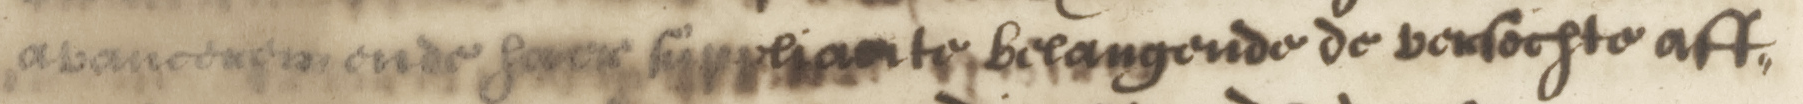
avanceren ende haer suppliante belangende de versochte aff„
